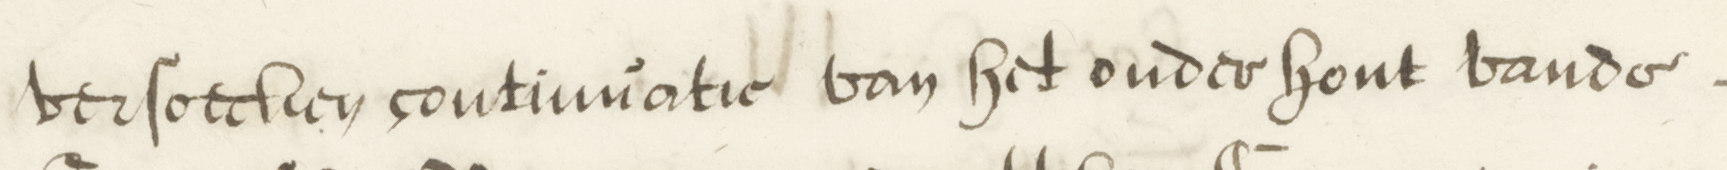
versoecken continuatie van het onderhout vande
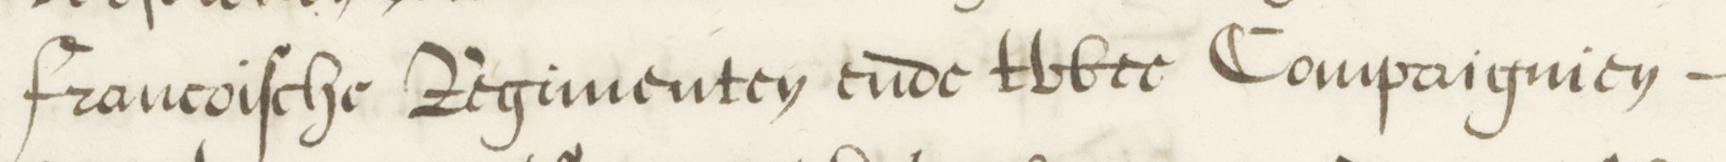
Francoische Regimenten ende twee Compaignien
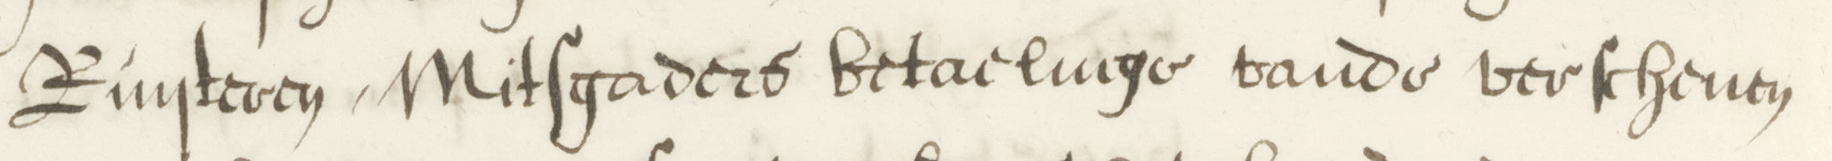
Ruyteren, Mitsgaders betaelinge vande verschenen
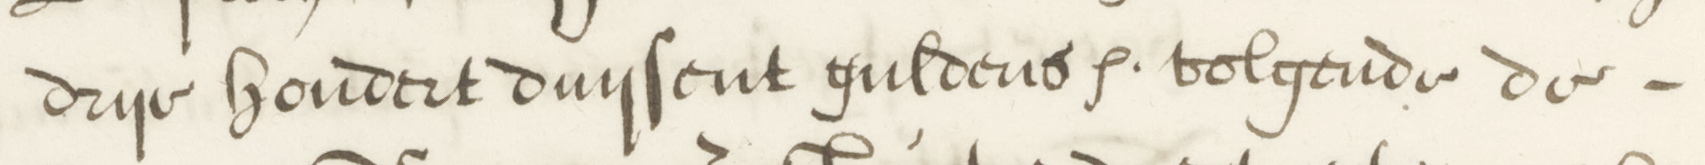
drye hondert duysent guldens f. volgende de
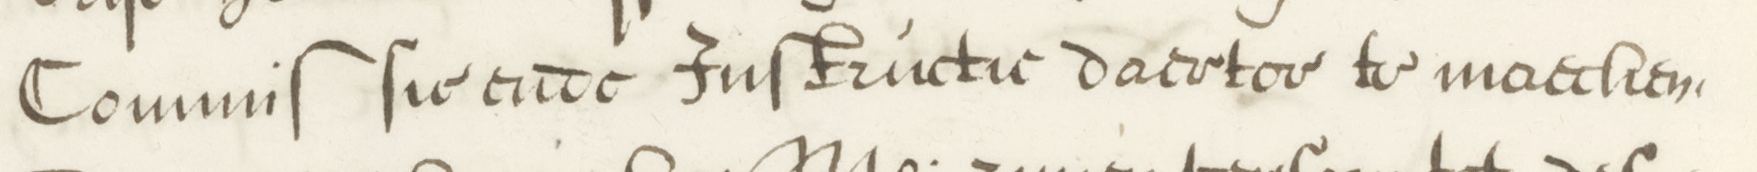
Commissie ende Instructie daertoe te maecken,
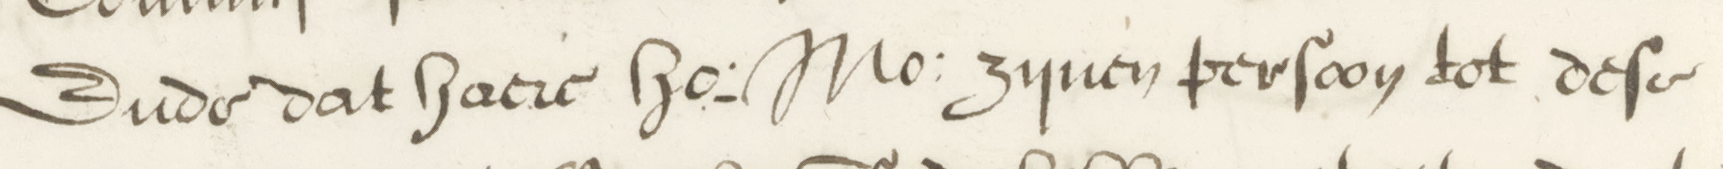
Ende dat haere Ho:Mo: zynen persoon tot dese
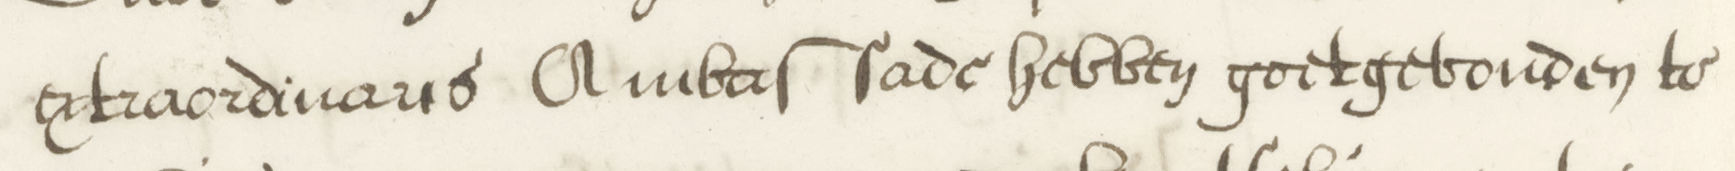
extraordinaris Ambassade hebben goetgevonden te
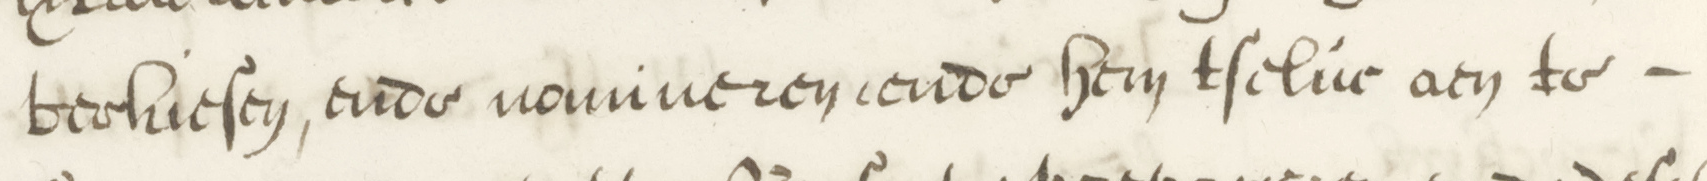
verkiesen, ende nomineren, ende hem tselue aen te
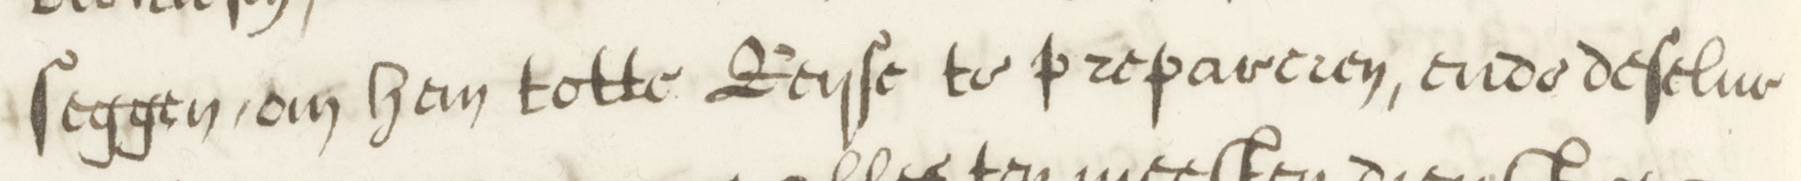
seggen, om hem totte Reyse te prepareren, ende deselue
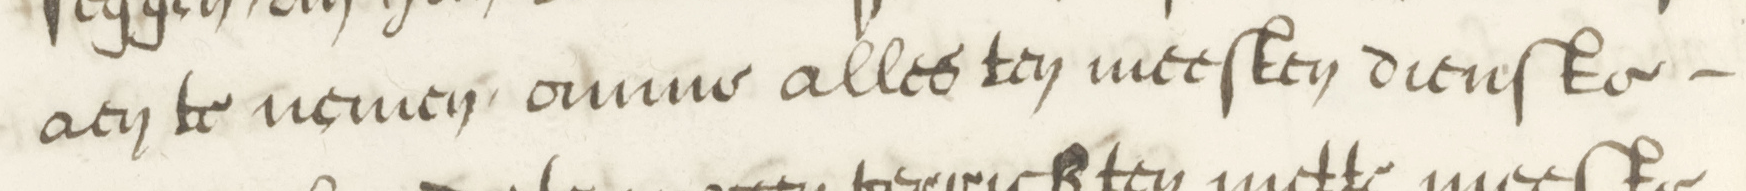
aen te nemen, omme alles ten meesten dienste
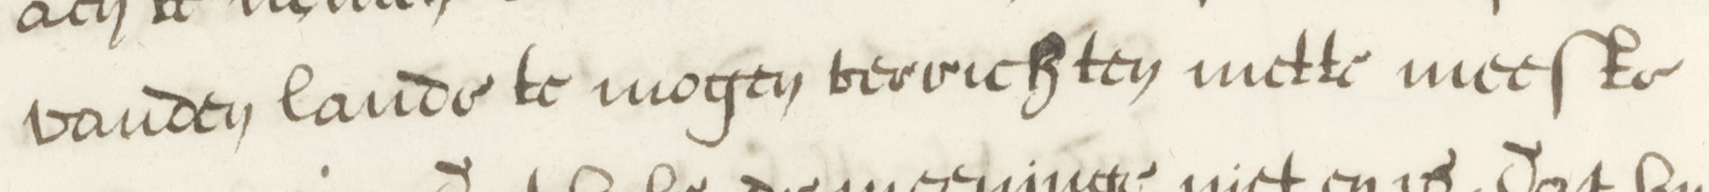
vanden lande te mogen verrichten mette meeste
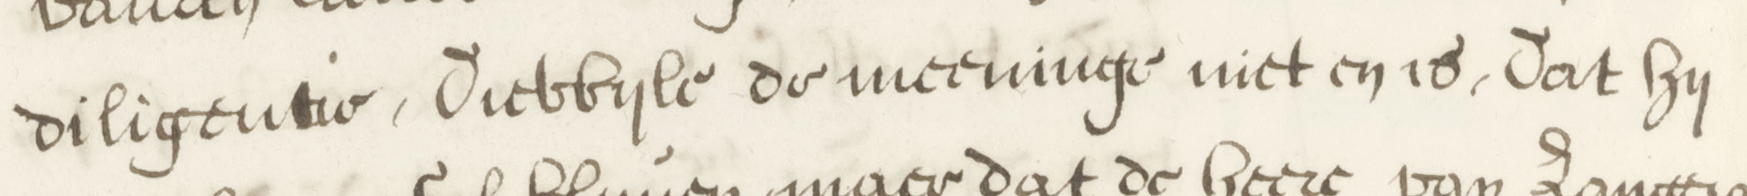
diligentie, diewyle de meeninge niet en is, dat hy
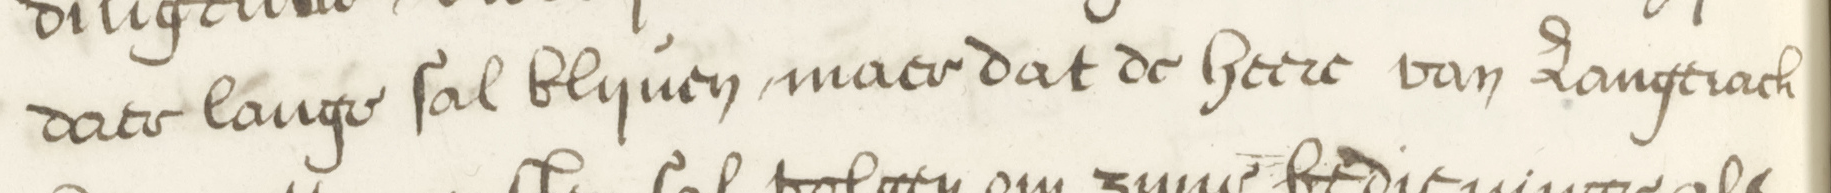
daer lange sal blyuen, maer dat de heere van Langerack
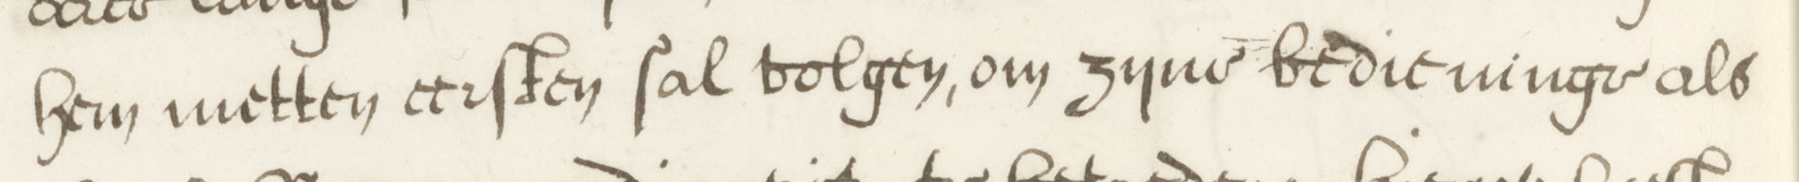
hem metten eersten sal volgen, om zyne bedieninge als
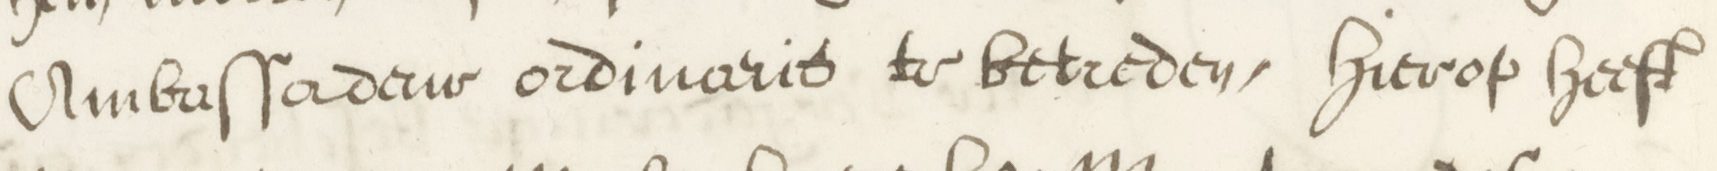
Ambassadeur ordinaris te betreden, hierop heeft
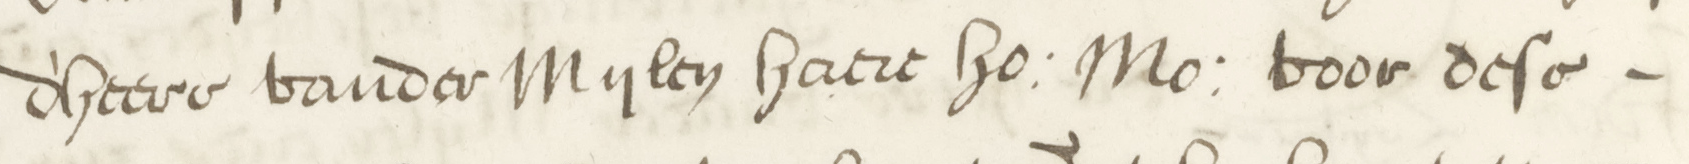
d'heere vander Mylen haere Ho:Mo: voor dese -
